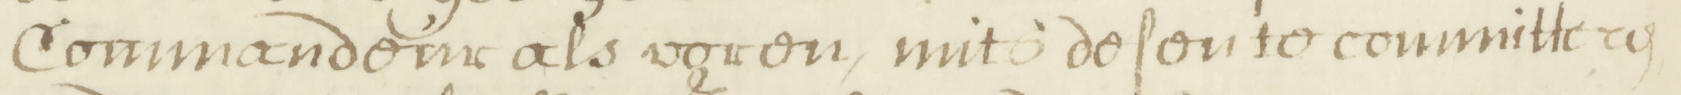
Commandeur als voren, mits desen te committeren
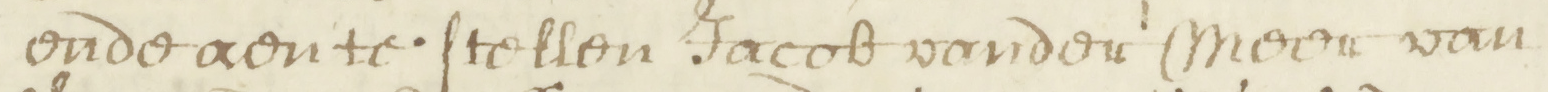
ende aen te stellen Jacob vander Meer van
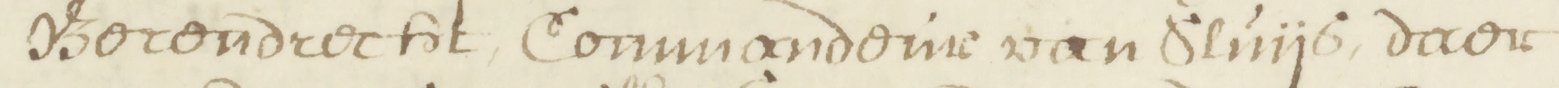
Berendrecht, Commandeur van Sluijs, daer
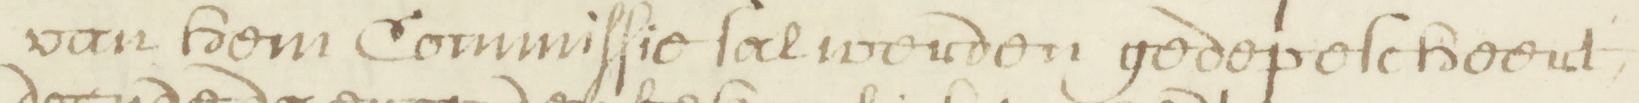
van hem Commissie sal werden gedepescheert,
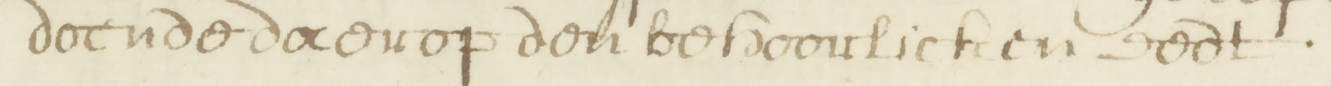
doende daerop den behoorlicken eedt.
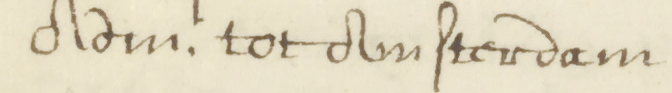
Admt. tot Amsterdam
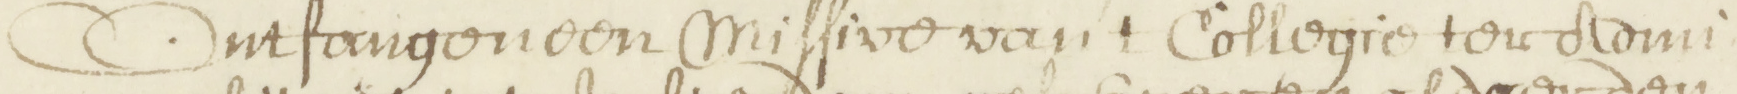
Ontfangen een Missive van't Collegie ter Admi„
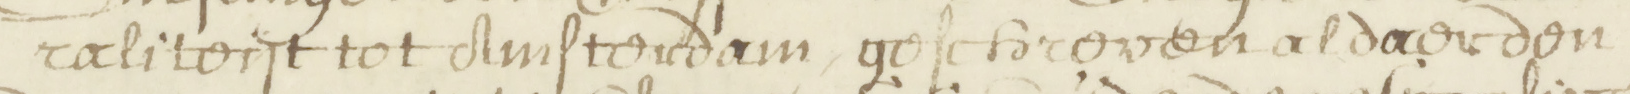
raliteijt tot Amsterdam, geschreven aldaer den
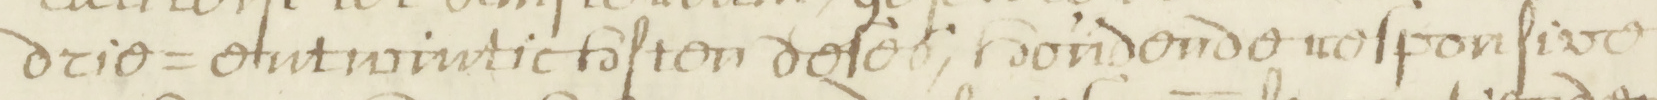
drie=entwintichsten deses, houdende responsive
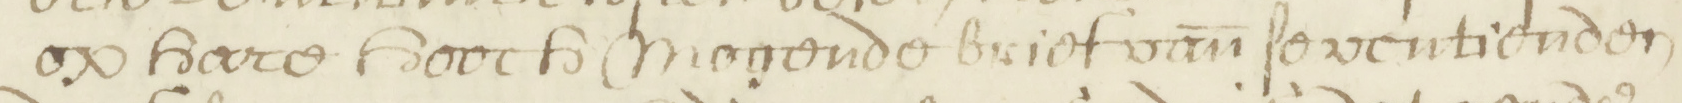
op hare Hooch Mogende brief van seventienden
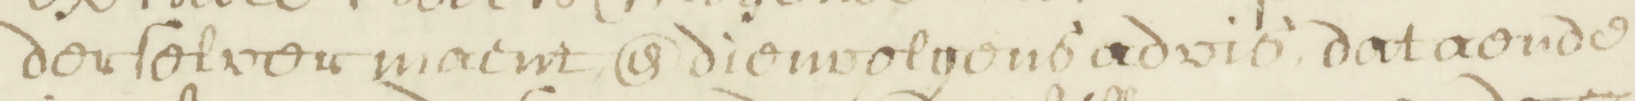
derselver maent, & dienvolgens advis, dat aende
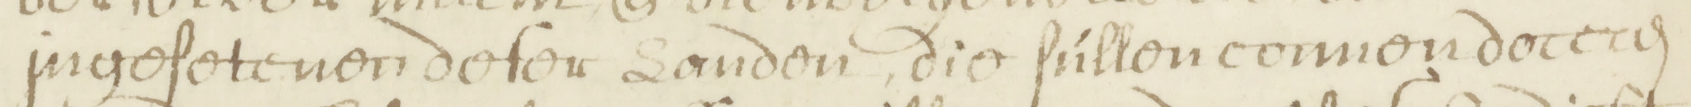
Ingesetenen deser Landen, die sullen connen doceren
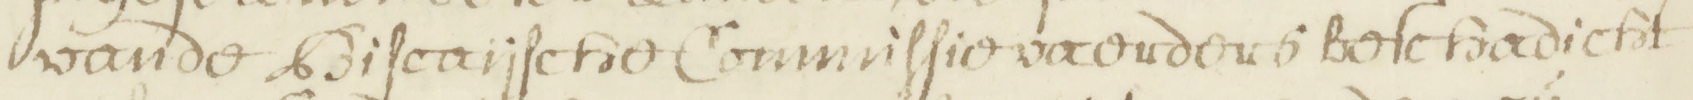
vande Biscaijsche Commissie vaerders beschadicht
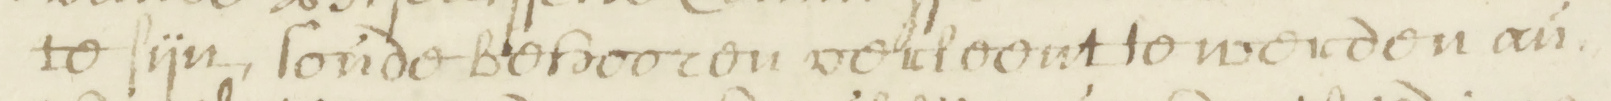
te sijn, soude behooren verleent te werden au„
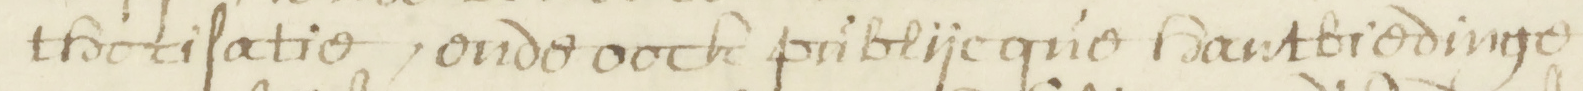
thorisatie, ende oock publijcque hantbiedinge
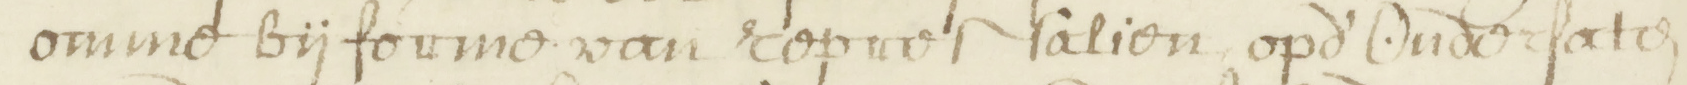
omme bij forme van repressalien, opd' Ondersaten
